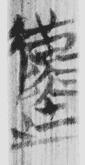{辶堇}
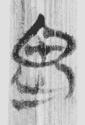畏
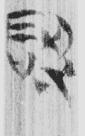叚
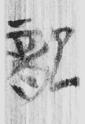龍
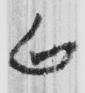㠯（以）
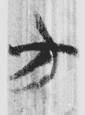方
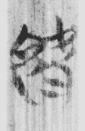既
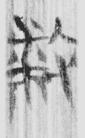敝
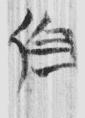於
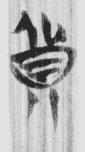貨
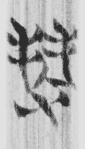彗
